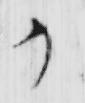人
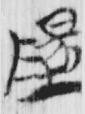○（陽）
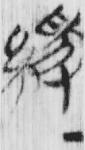緩
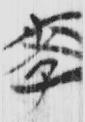李
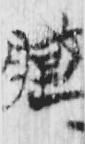○（臧）
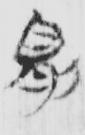{胃刀}（謂）
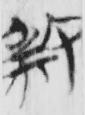殺
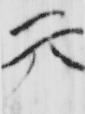亓（其）
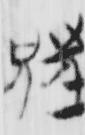○（兄）
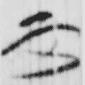正
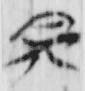{日亓}（期）
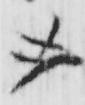之
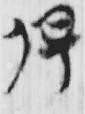但
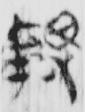捭
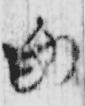爲
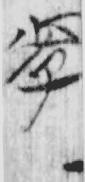李
